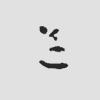乃
